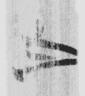之
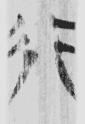行
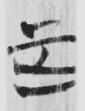正
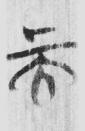而
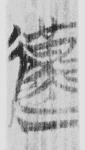{辶堇}
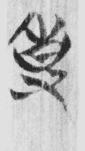事
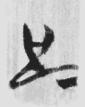也
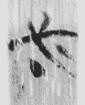心
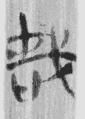哉
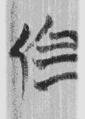於
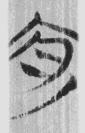宜
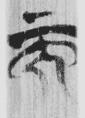而
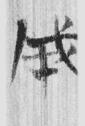成
